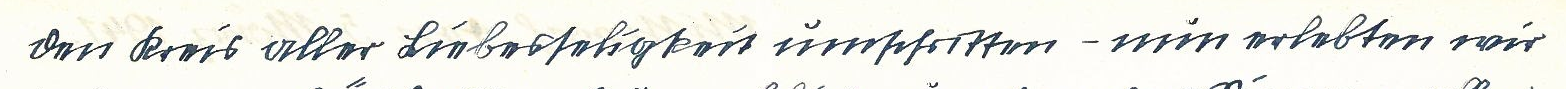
den Kreis aller Liebesseligkeit umschritten – nun erlebten wir
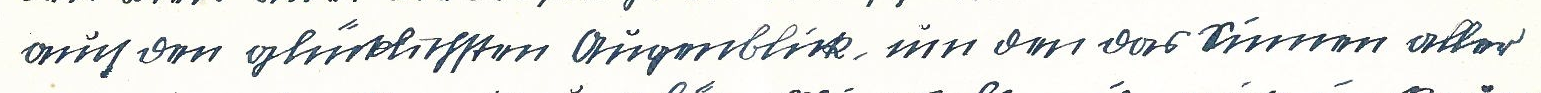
auch den glücklichsten Augenblick, um den das Sinnen aller
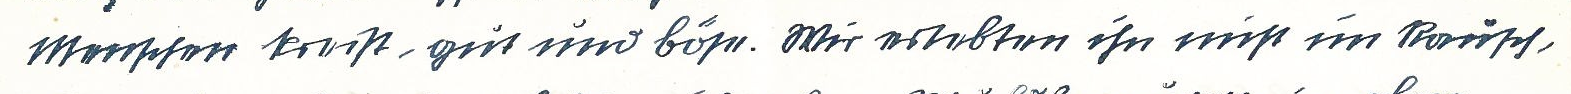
Menschen kreist, gut und böse. Wir erlebten ihn nicht im Rausch,
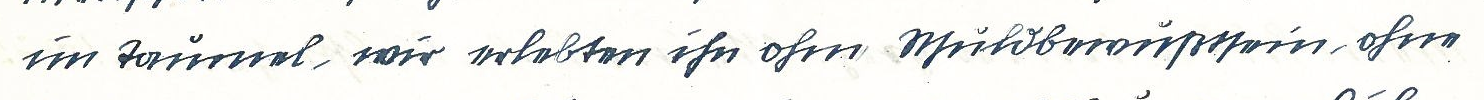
im Taumel, wir erlebten ihn ohne Schuldbewußtsein, ohne
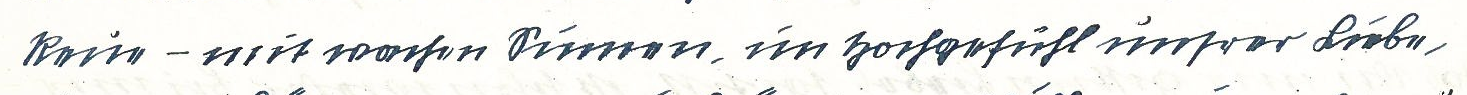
Reue – mit wachen Sinnen, im Hochgefühl unsrer Liebe,
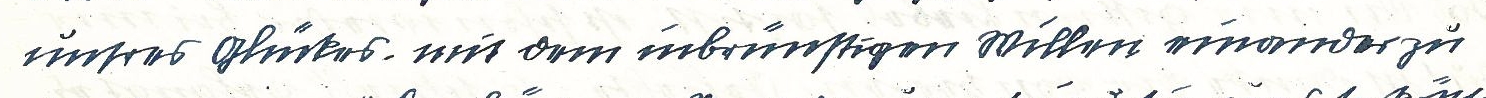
unsres Glückes, mit dem inbrünstigen Willen einander zu
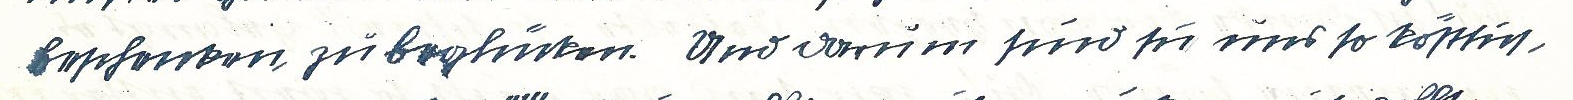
beschenken, zu beglücken. Und darum sind sie uns so köstlich
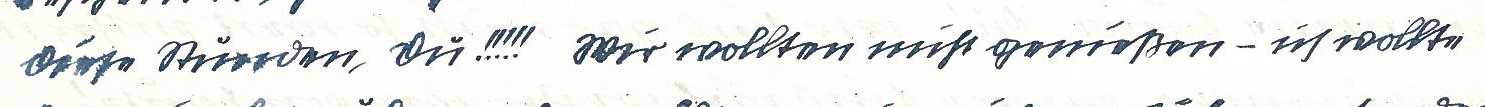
diese Stunden, Du!!!!! Wir wollten nicht genießen – ich wollte
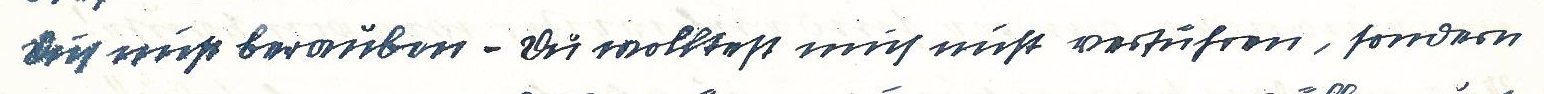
Dich nicht berauben – Du wolltest mich nicht verführen, sondern
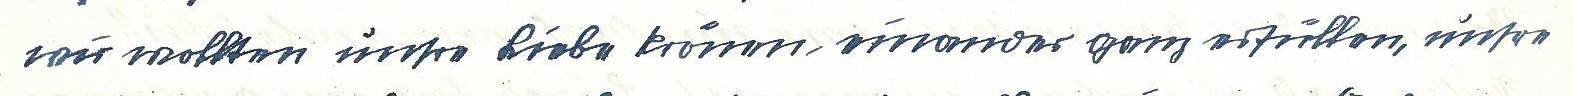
wir wollten unsre Liebe krönen, einander ganz erfüllen, unsre
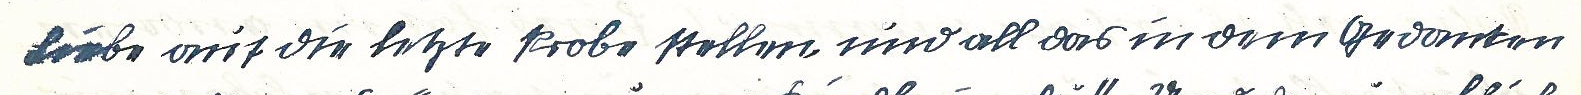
Liebe auf die letzte Probe stellen und all das in dem Gedanken
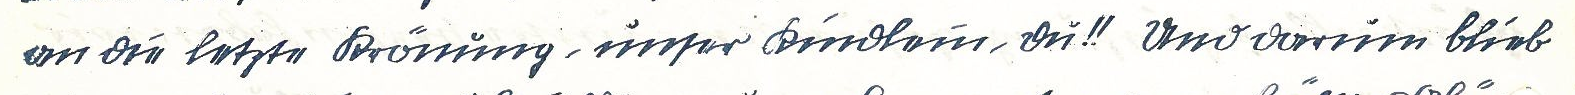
an die letzte Krönung, unser Kindlein, Du!! Und darum blieb
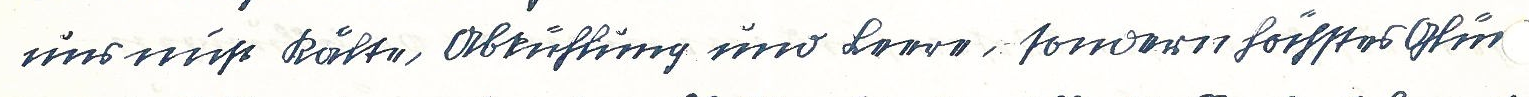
uns nicht Kälte, Abkühlung und Leere, sondern höchstes Glü
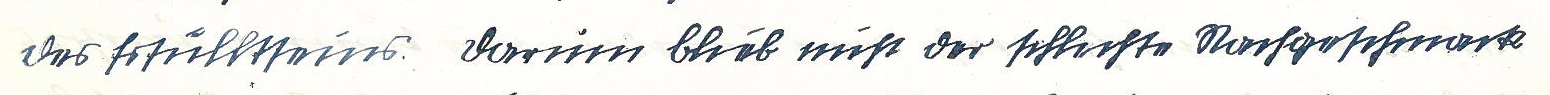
des Erfülltseins. Darum blieb nicht der schlechte Nachgeschmack
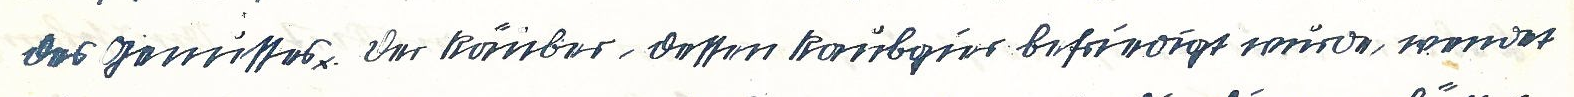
des Genusses. Der Räuber, dessen Raubgier befriedigt wurde, wendet
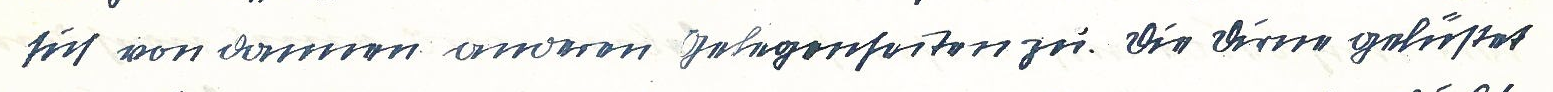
sich von dannen anderen Gelegenheiten zu. Die Dirne gelüstet
